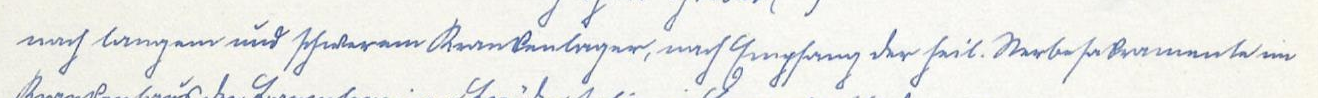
nach langen und schwerem Krankenlager, nach Empfang der heil. Sterbesakramente im
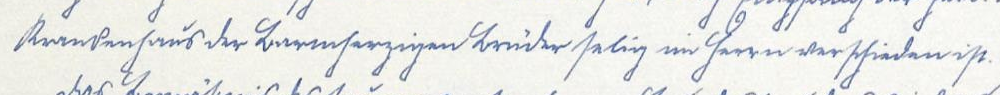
Krankenhaus der Barmherzigen Brüder selig im Herrn verschieden ist.
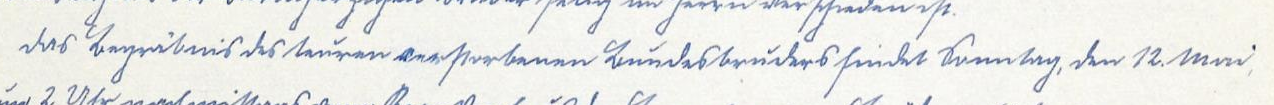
Das Begräbnis des teuren verstorbenen Bundesbruders findet Sonntag, den 12. Mai,
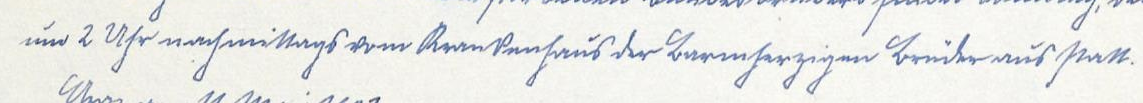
um 2 Uhr nachmitags vom Krankenhaus der Barmherzigen Brüder aus statt.
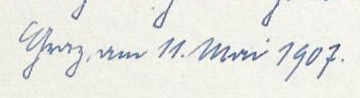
Graz. am 11. Mai 1907.
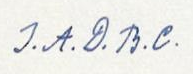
I. A. D. B. C.
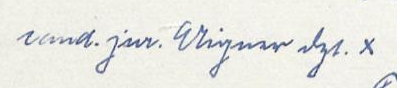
cand. jur Aigner dzt. x
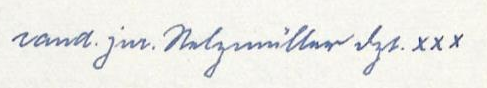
cand. jur Stelzmüller dzt. xxx
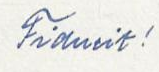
Fiducit!
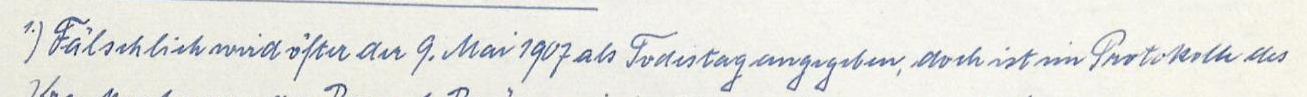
1) Fälschlich wird öfter der 9. Mai 1907 als Todestag angegeben, doch ist im Protokolle des
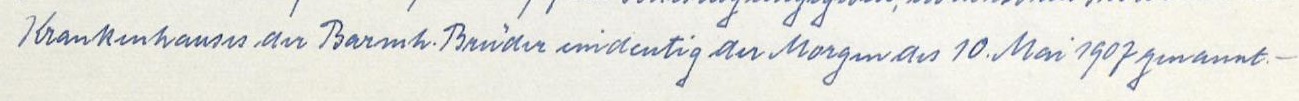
Krankenhauses der Barmh. Brüder eindeutig der Morgen des 10. Mai 1907 genannt.
